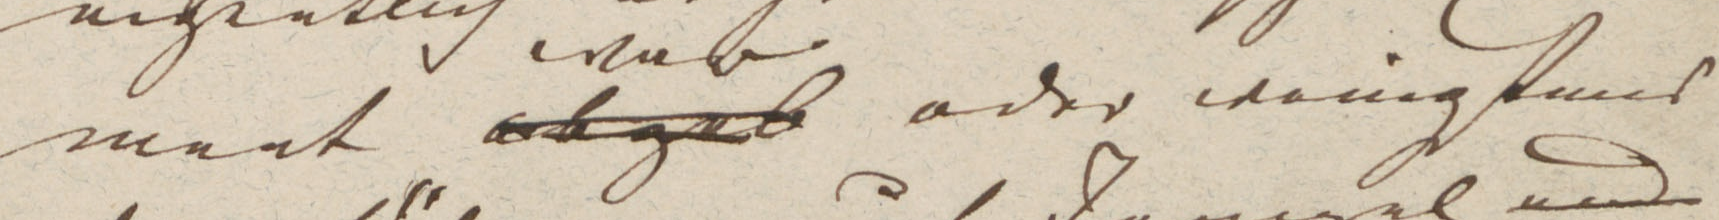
ment abgab war oder wenigstens
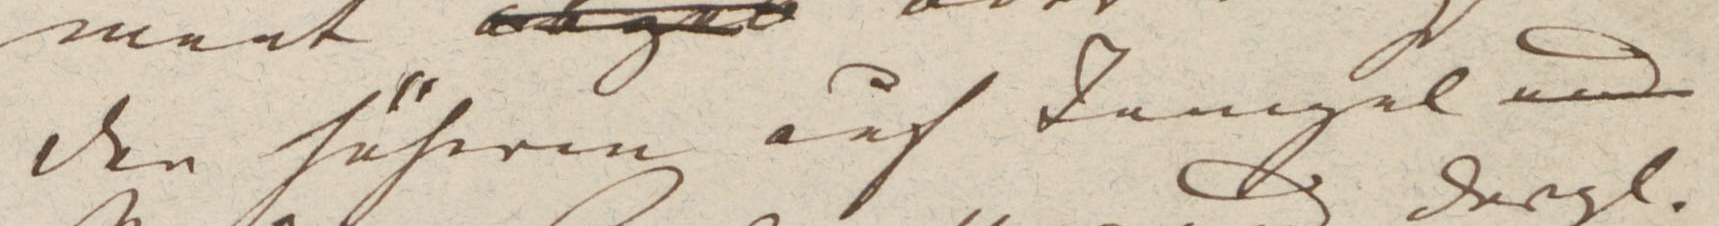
den höheren auf Tempel und
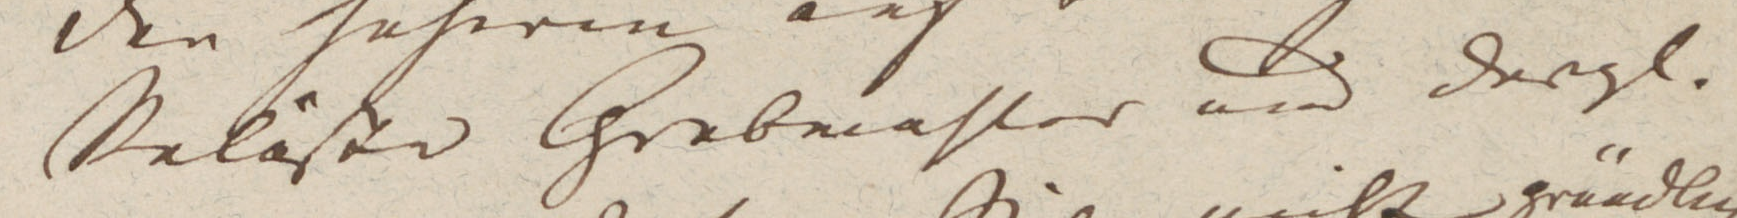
Paläste Grabmahler und dergl.
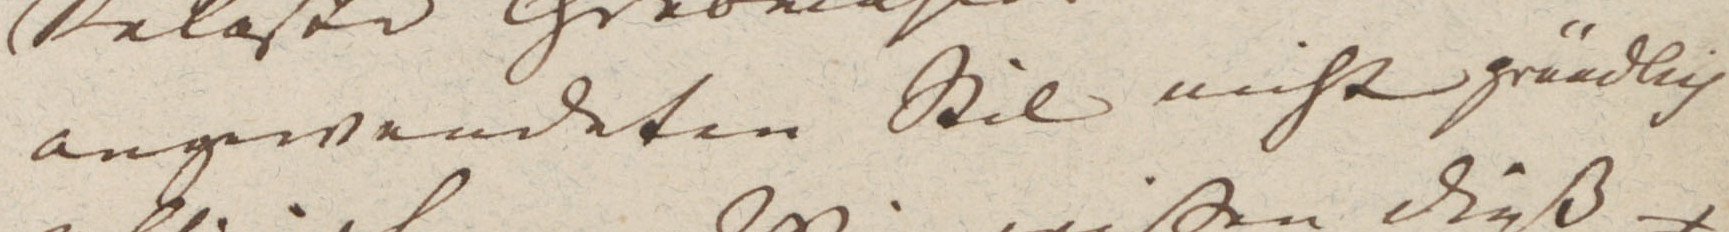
angewendeten Stil nicht gründlich
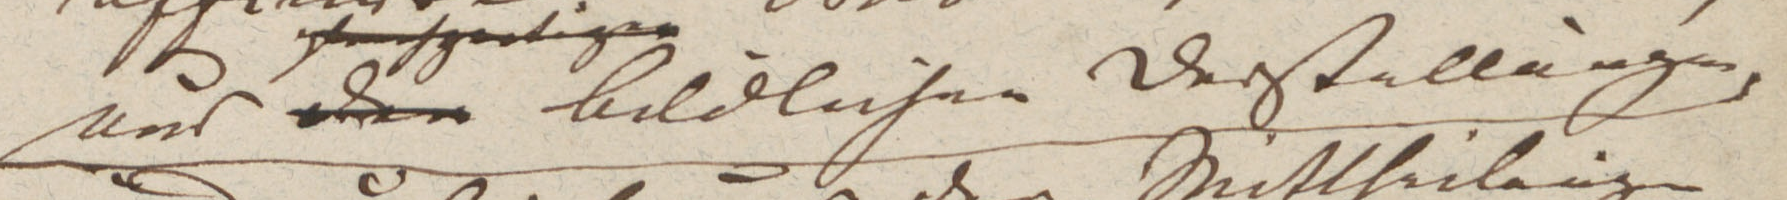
gleichzeitigen bildlichen Darstellungen %
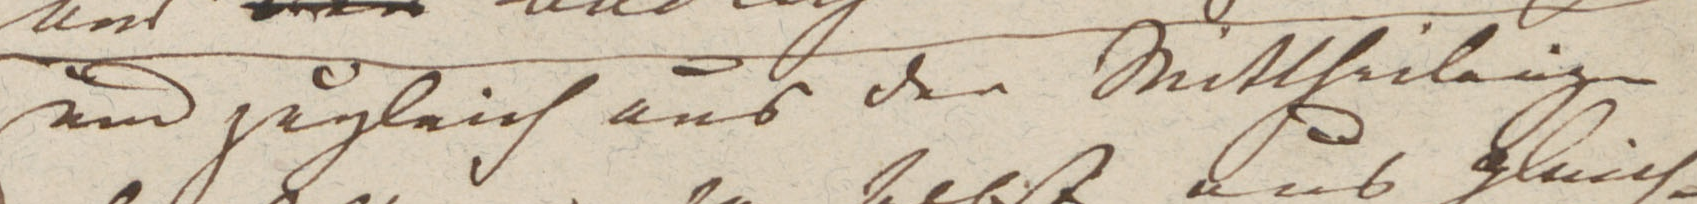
und zugleich aus den Mittheilungen
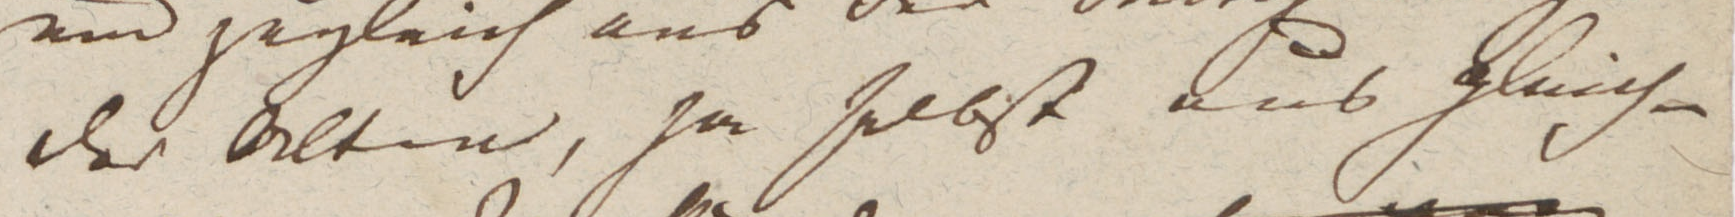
der Alten, ja selbst aus gleich-
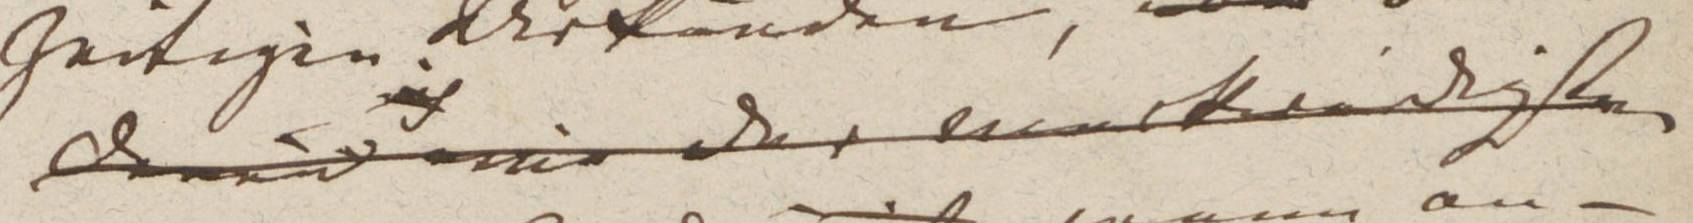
denen ich mir der merwürdigste
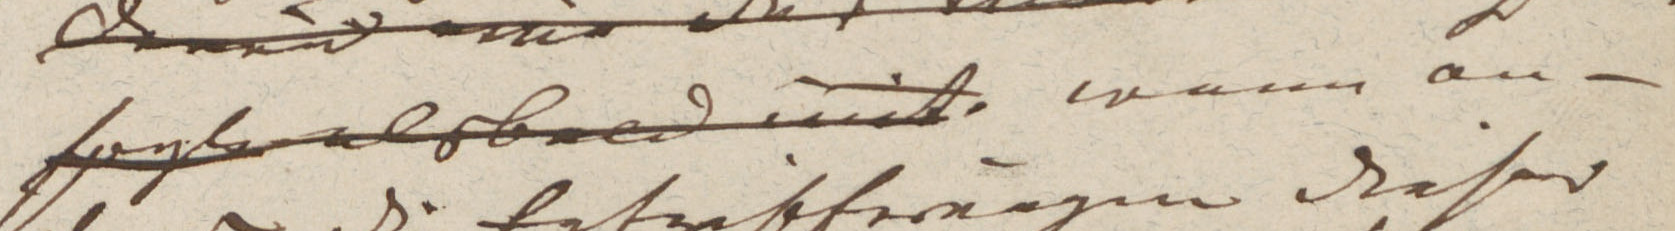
sogl alsbald mit wenn an-
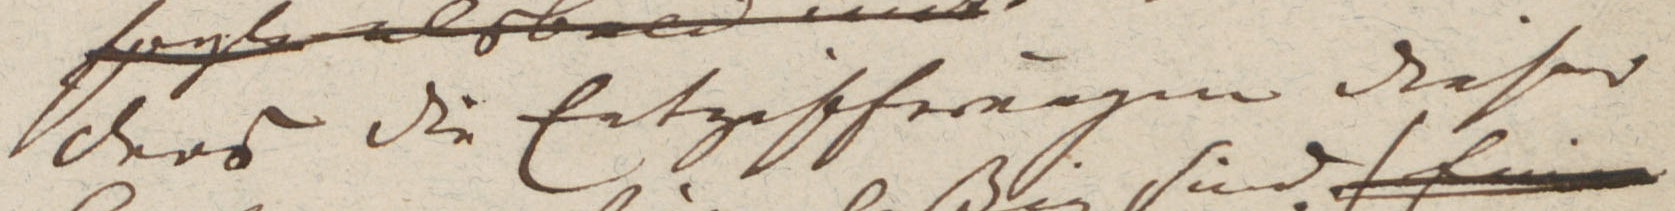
ders die Entzifferungen dieser
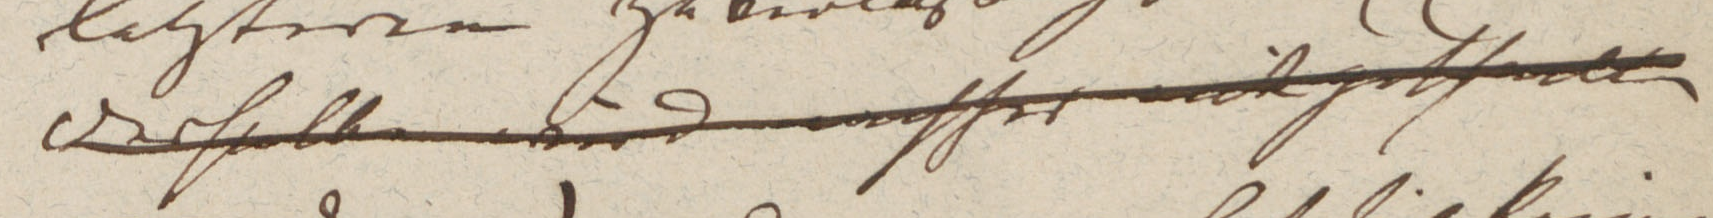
derselben wird nachher mitgetheilt
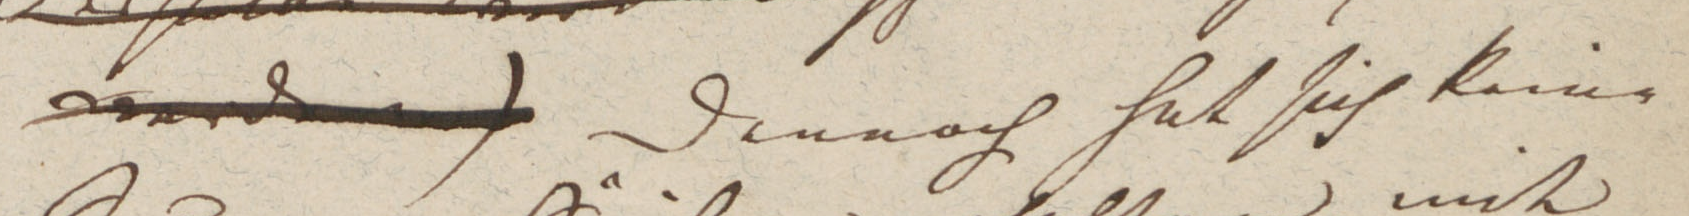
werden) Dennoch hat sich keine
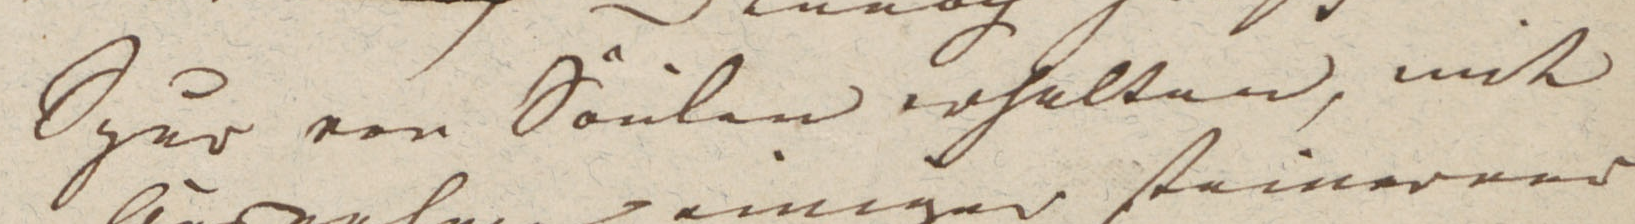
Spur von Säulen erhalten, mit
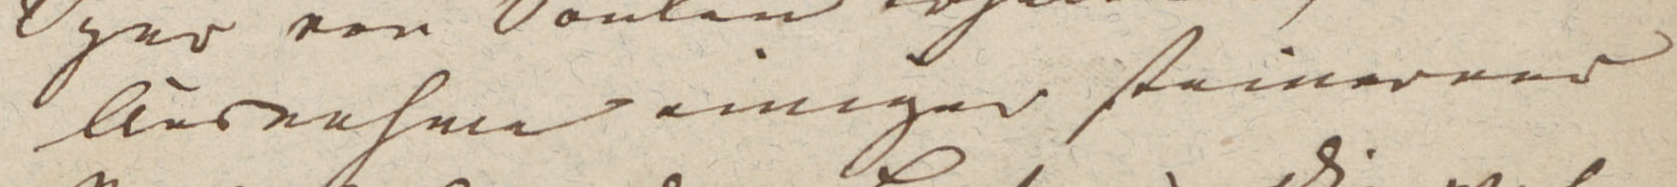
Ausnahme einiger steinerner
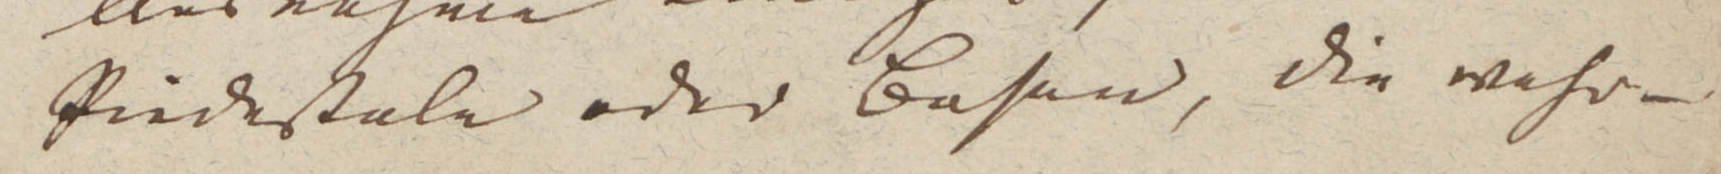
Piedestale oder Basen, die wahr-
